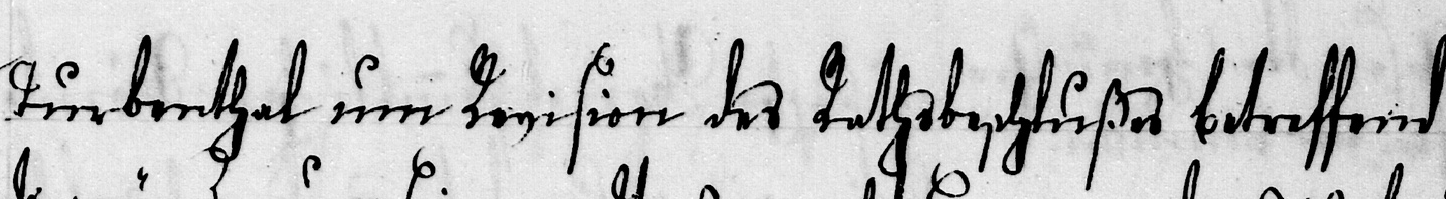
Turbenthal um Revision des Rathsbeschlußes betreffend
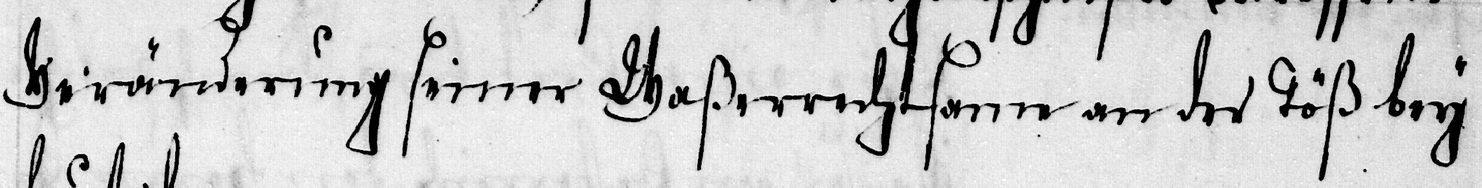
Veränderung seiner Waßerrechtsame an der Töß bey
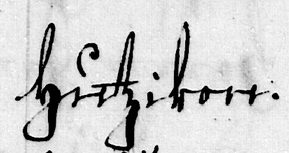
Hutzikon.
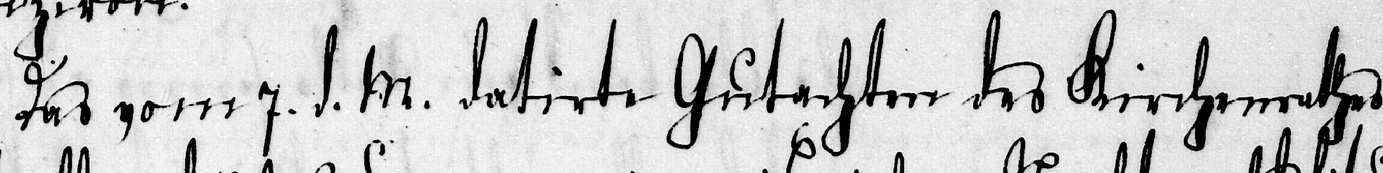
Das vom 7. d. M. datirte Gutachten des Kirchenrathes
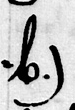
b.)
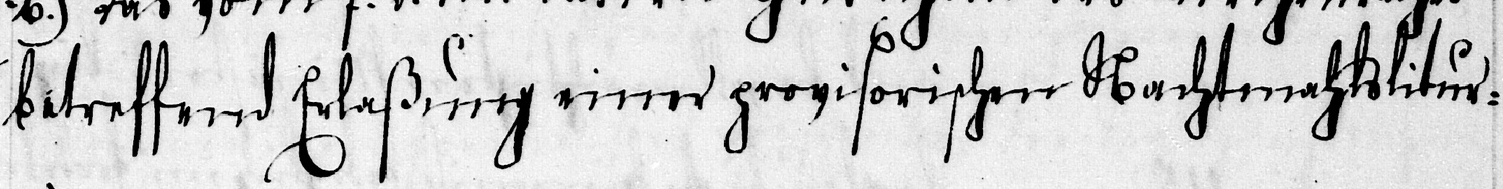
betreffend Erlaßung einer provisorischen Nachtmahlslitur¬
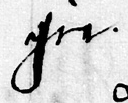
gie.
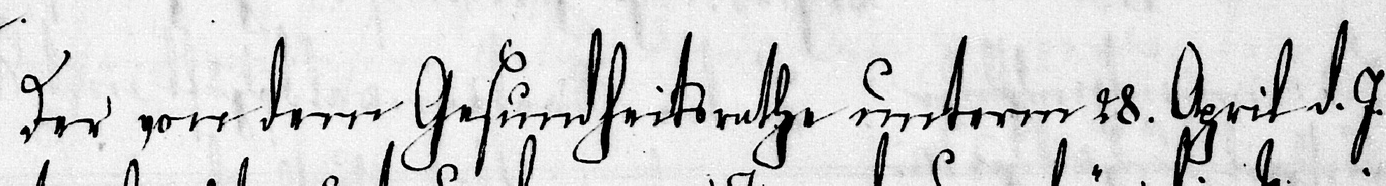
Der von dem Gesundheitsrathe unterm 28. April d.
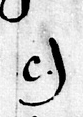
c.)
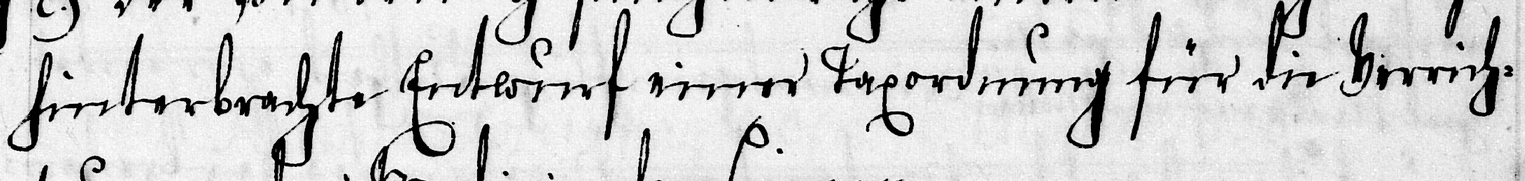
hinterbrachte Entwurf einer Taxordnung für die Verrich¬
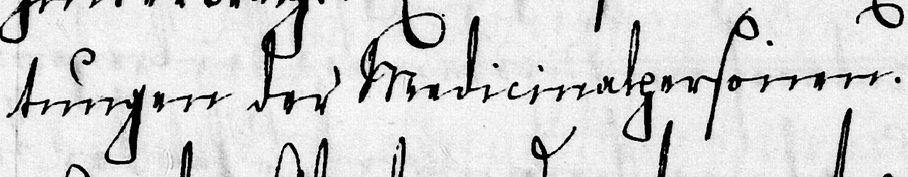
tungen der Medicinalpersonen.
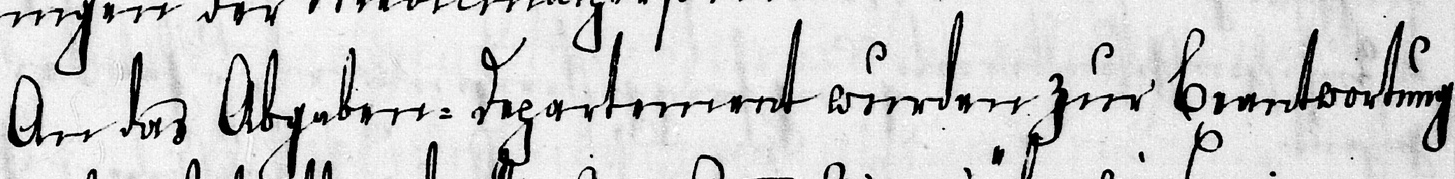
An das Abgaben-Departement wurden zur Beantwortung
